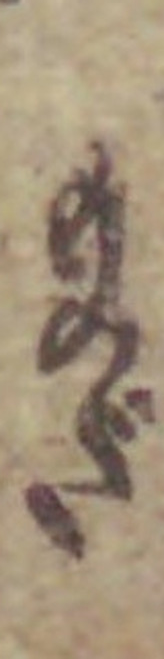ものだ
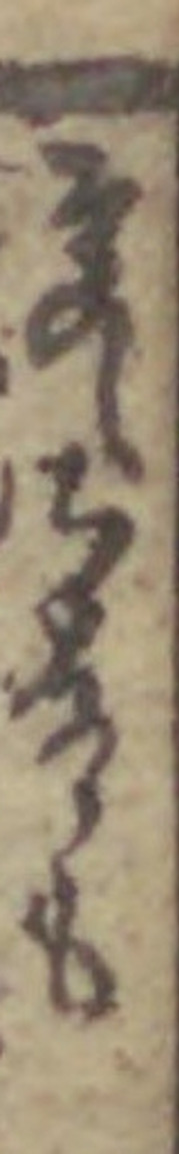そのゝちならも
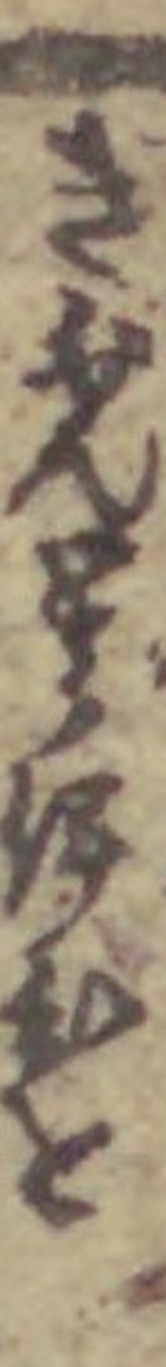きぶんとう伊ひを
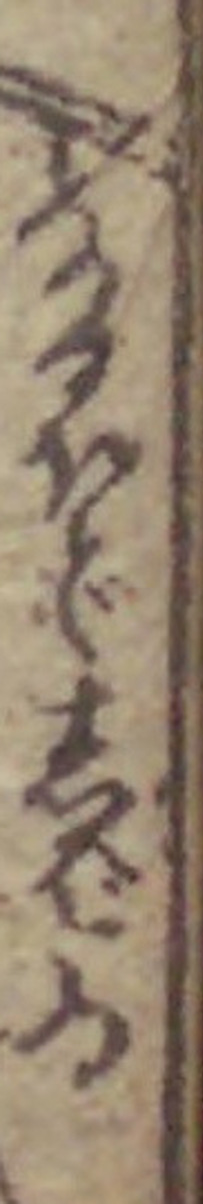なるほどしばゐ
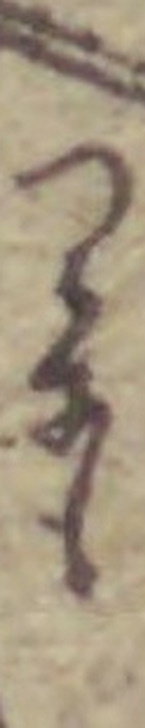つらにも
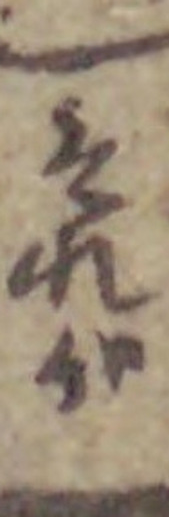それが
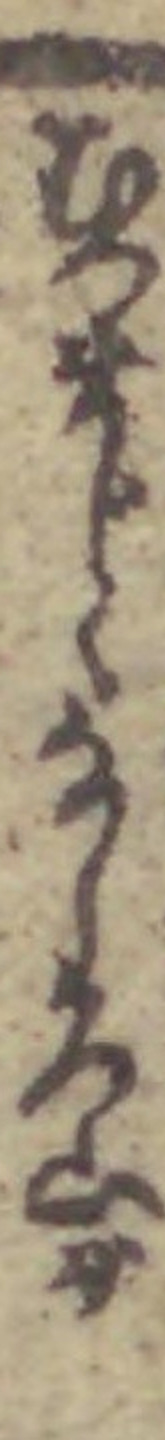むつまじくなしかつ山が
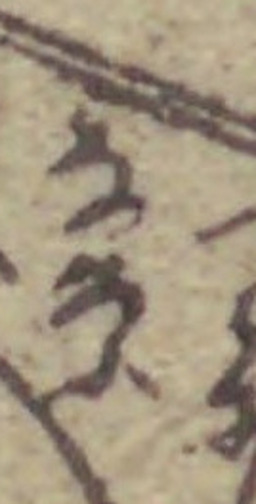なろふ
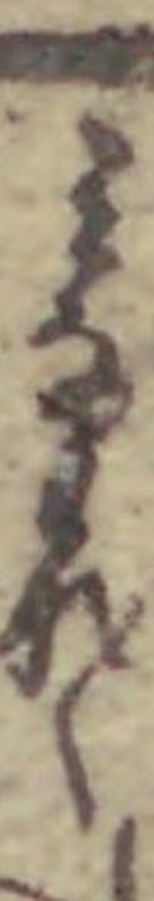みなわれ〳〵
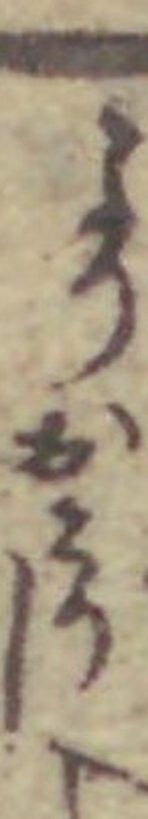よりおこりし
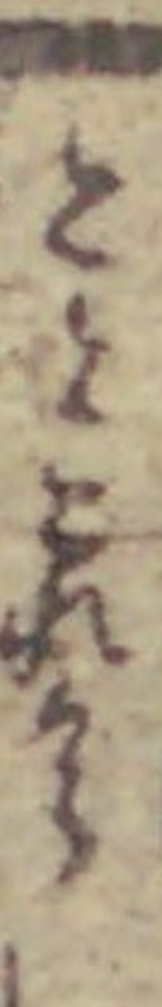ことこれから
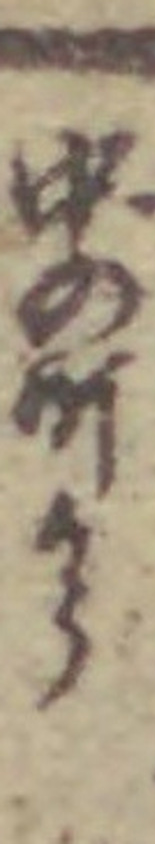中の町から
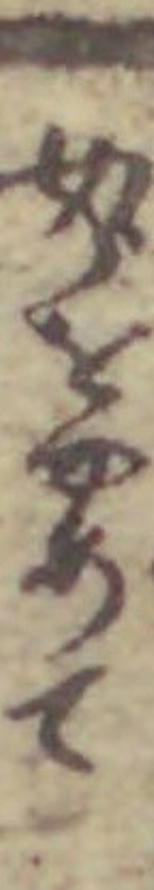女郎をやめて
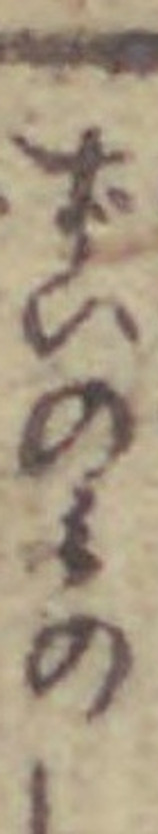ずいのみの
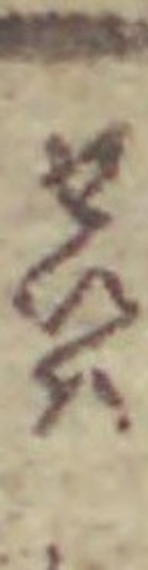せいは
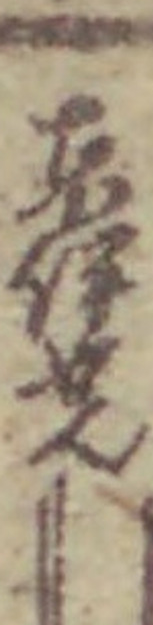東伊せん
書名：大通其面影 2巻
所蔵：国立国会図書館 National Diet Library, JAPAN
